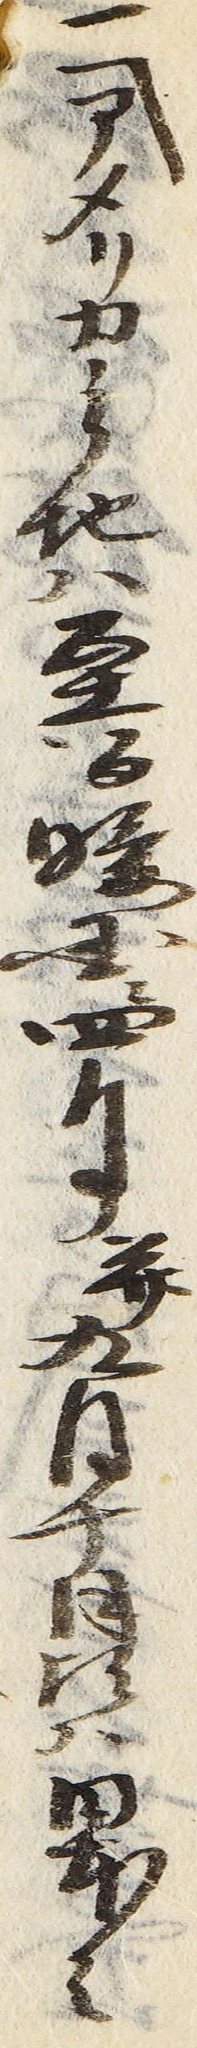一「アメリカ之地ハ至而暖国ニ四月幷九月十月頃ハ日本之
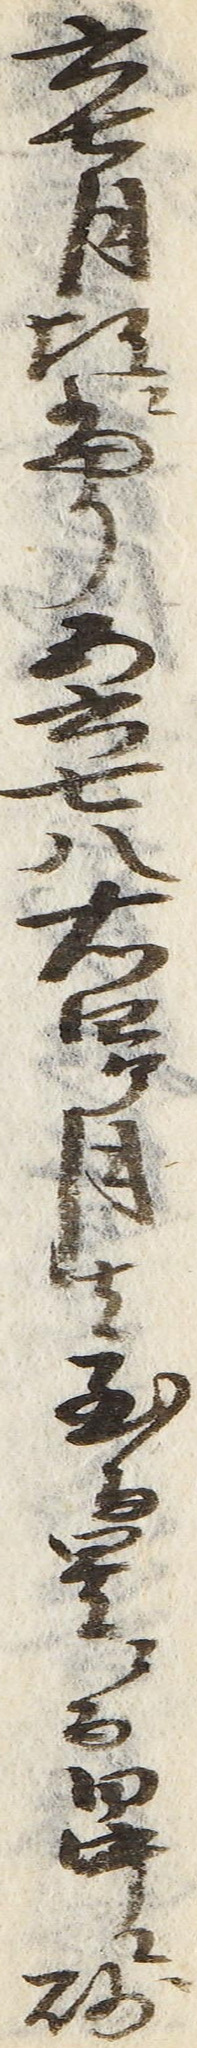六七月頃ニ當り五六七八右四ケ月者至而暑ニ而日中ニ砂
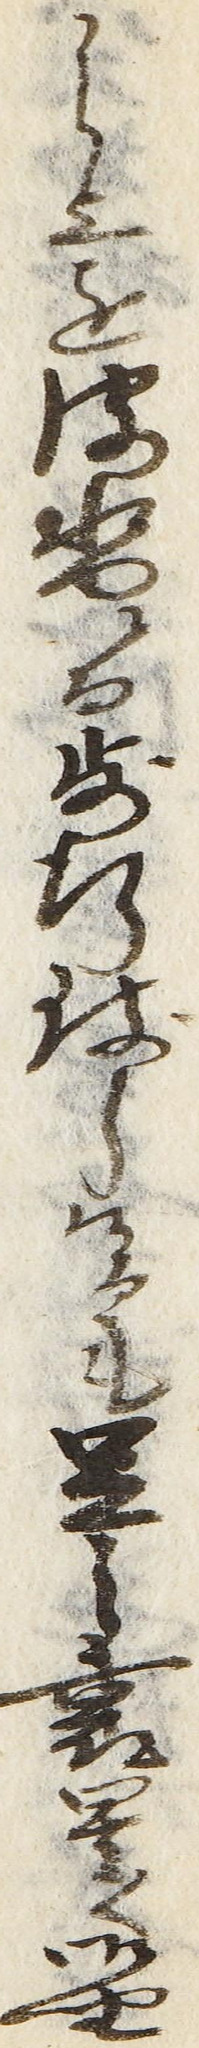之上を皮沓ニ而歩行致し候而も足之裏暑く御座
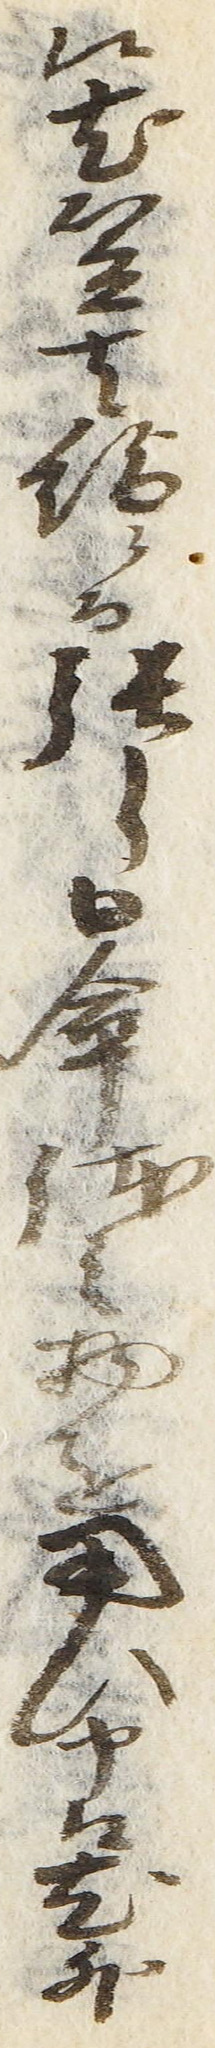候尤笠者絹ニ而張し日傘体之物を用ひ申候尤外
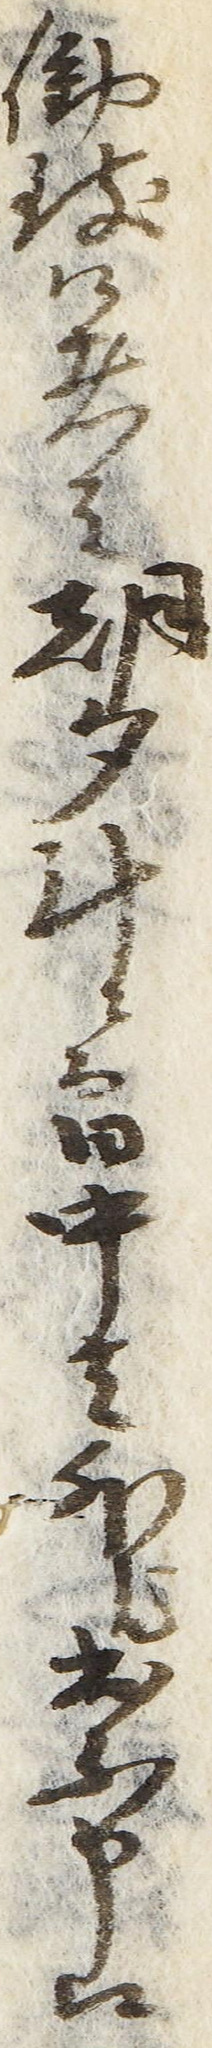働致候者之者朝夕斗ニ而日中者外江出不申候
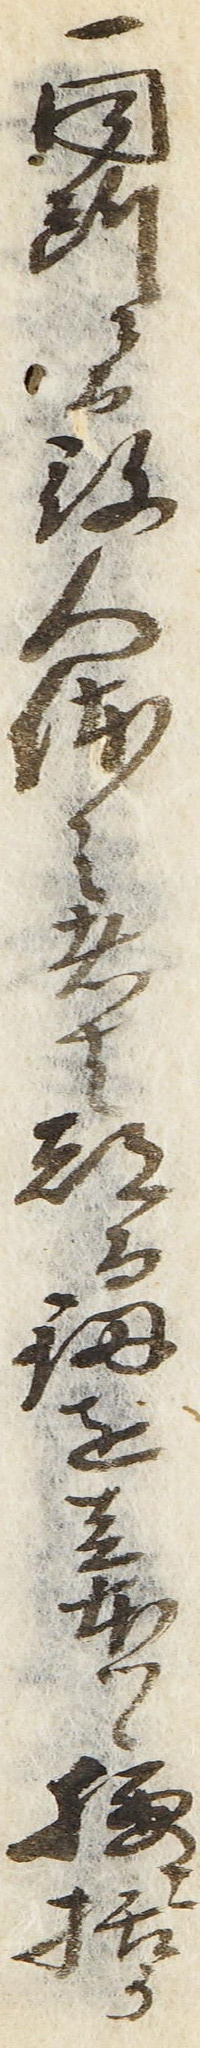一同所ニ而役人体之者は都而釼を壱本ツヽ腰ニ括り
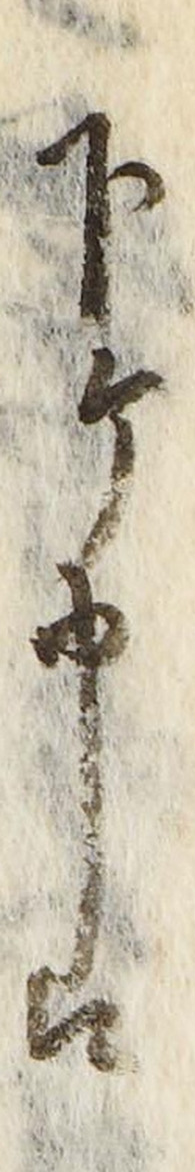下ケ申候
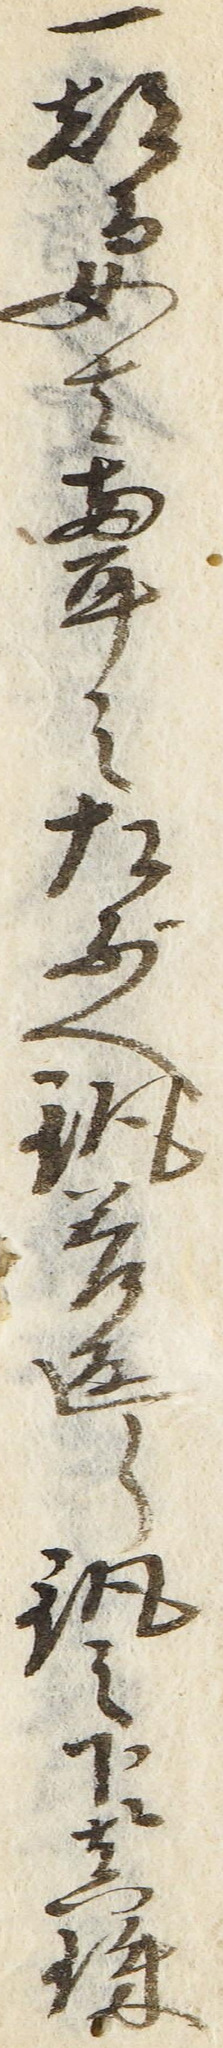一都而女者両耳之たぶへ銅差通し銅之下ニ真珠

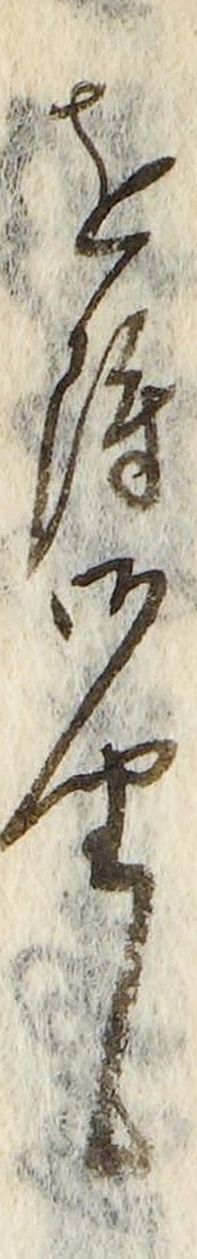を附御座候
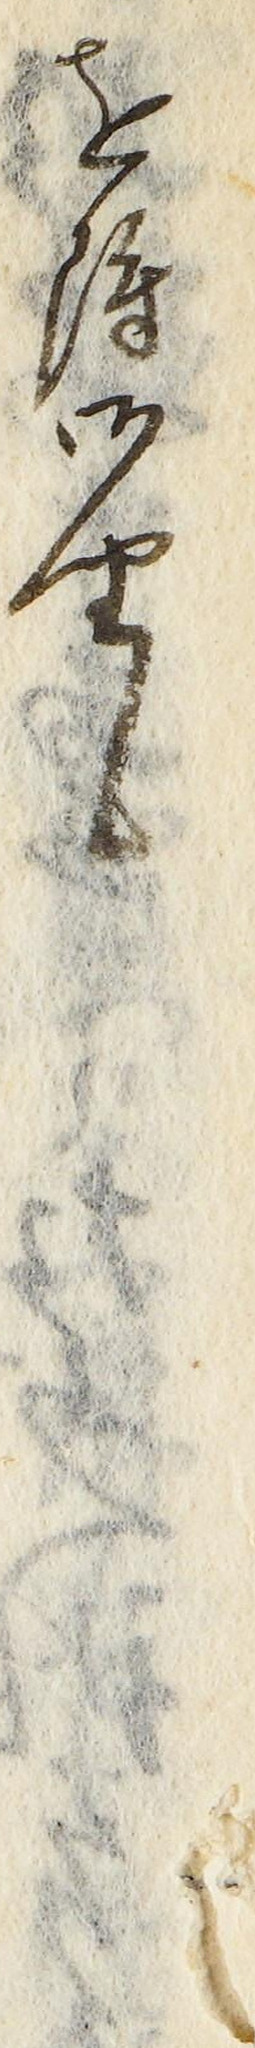を附御座候
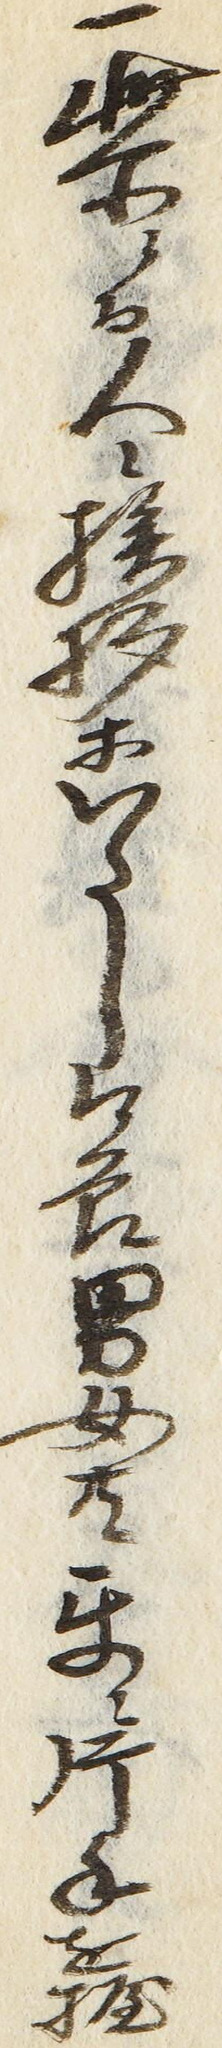一此所ニ而人々挨拶等いたし候節男女共互ニ片手を握
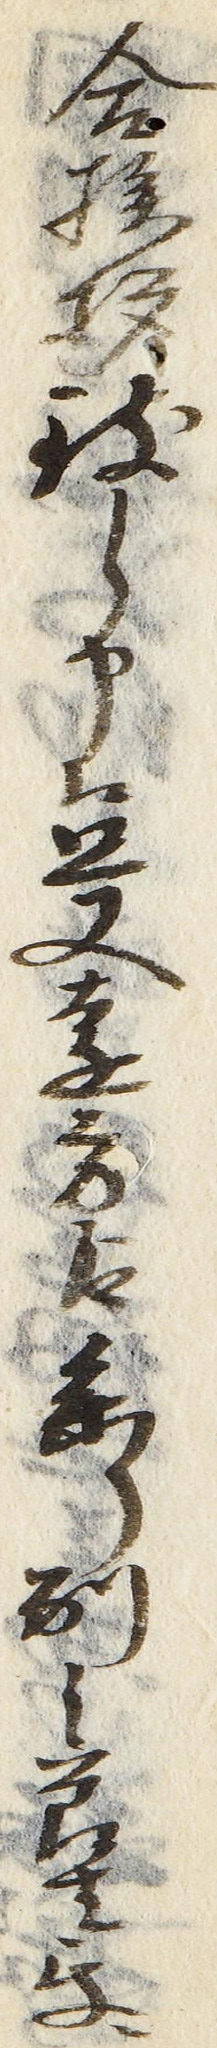合挨拶致し申候且又遠方江参り別之節者互ニ
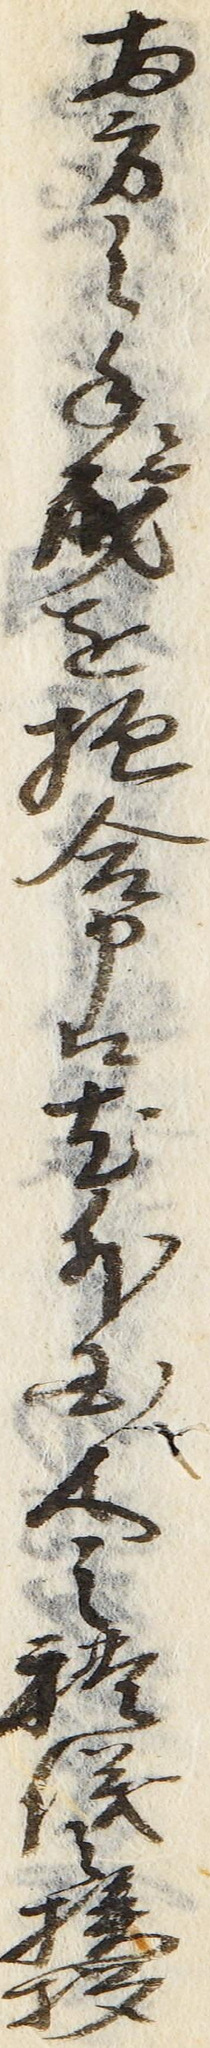両方之手ニ而身を抱合申候尤外国人之禮儀之挨拶
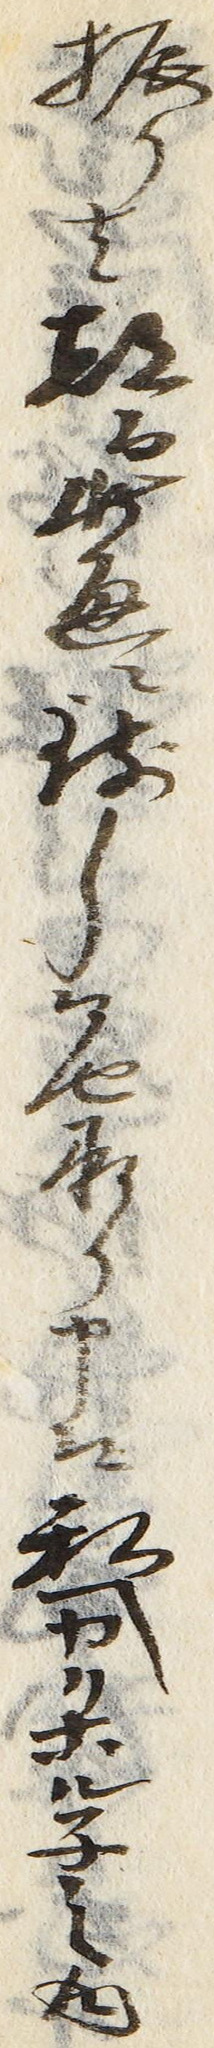振り者都而此通ニ致し候由承り申候私「カリホル子之内
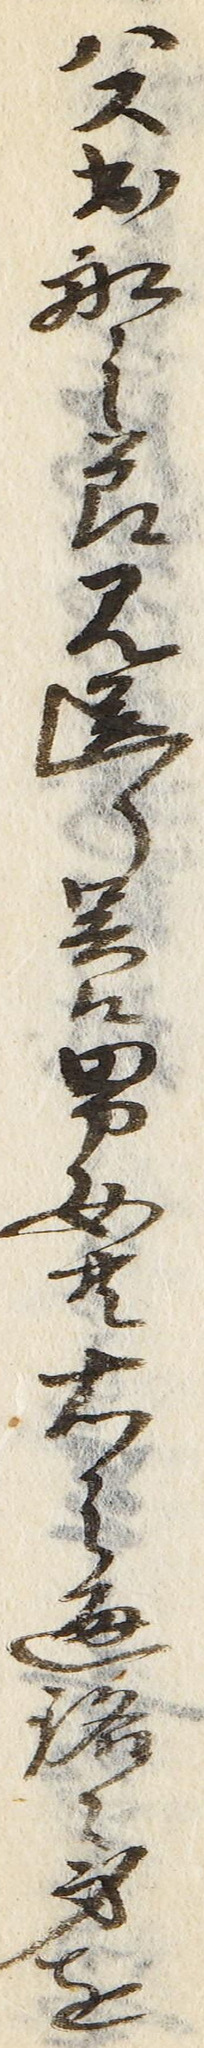ハス出舩之節見送り呉候男女共右之通銘々身を
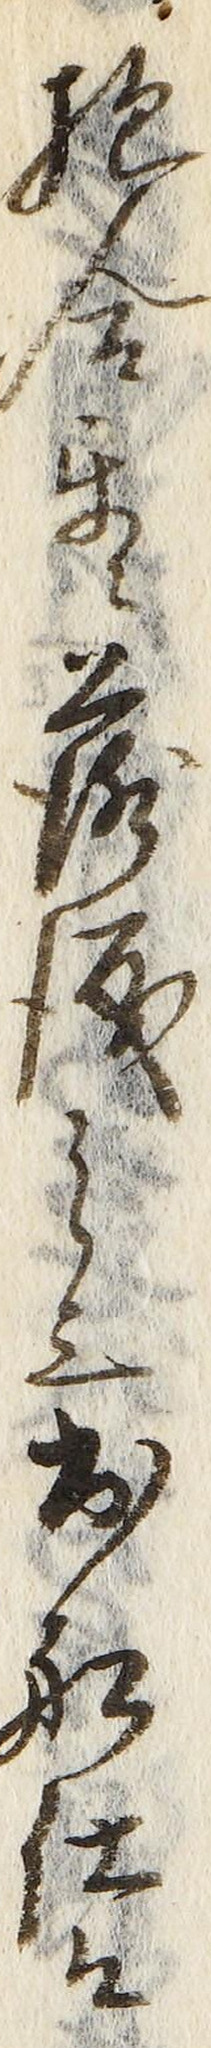抱合互ニ落涙之上出舩仕候
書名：漂流人善助聞書
